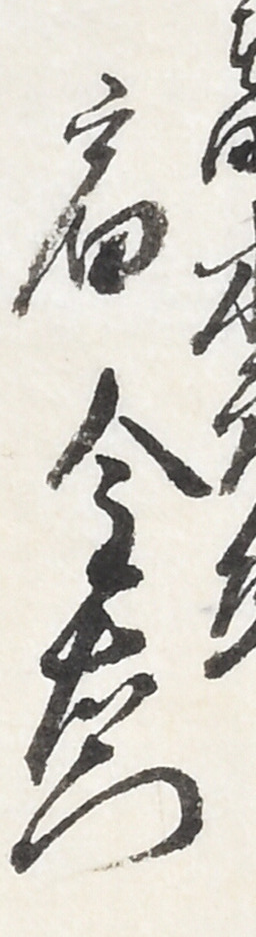宿金右衛門
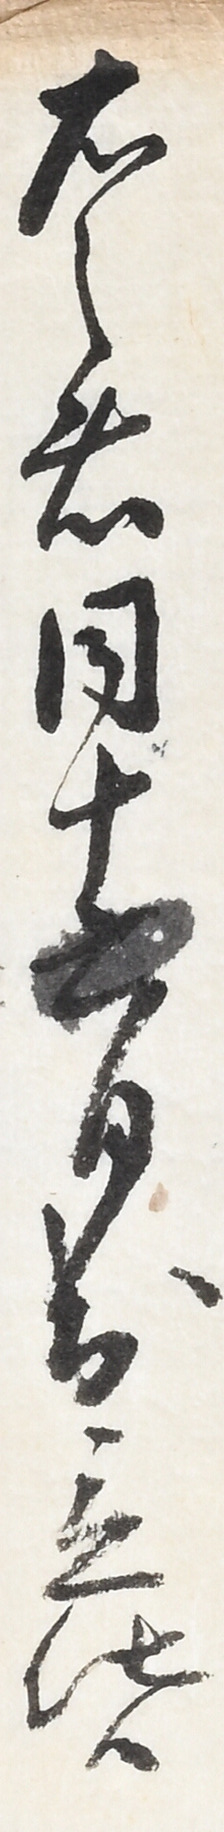右之者同十六日出立仕候
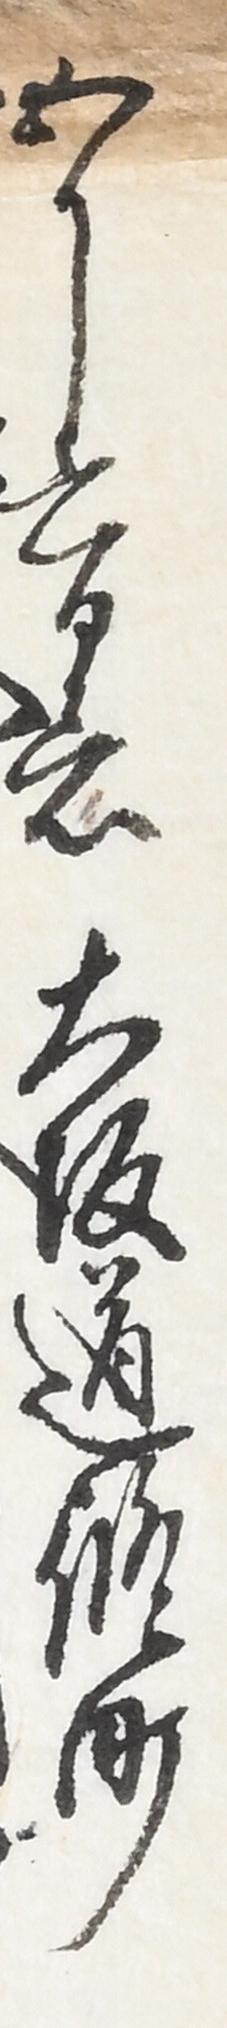五月六日着大坂道修町
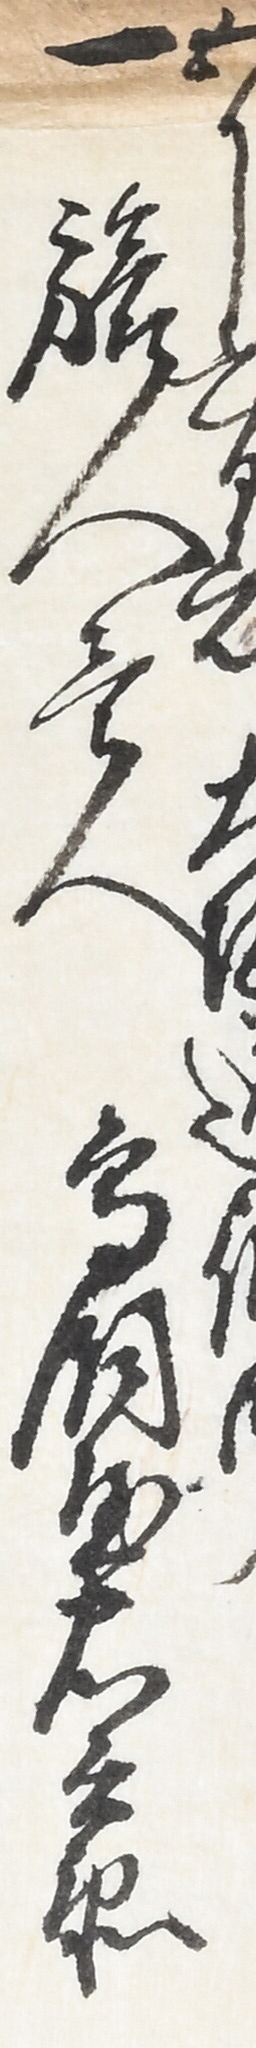一旅人壱人鳥飼屋忠兵衛
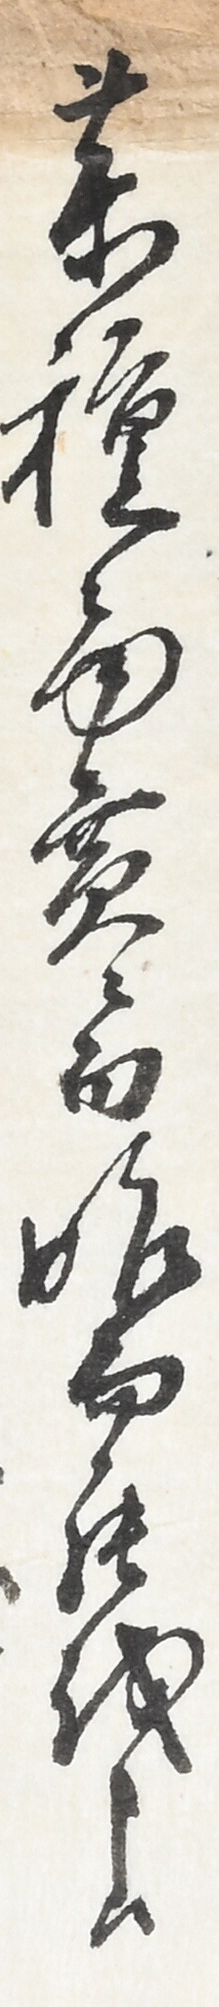薬種商売ニ而始而罷越申候
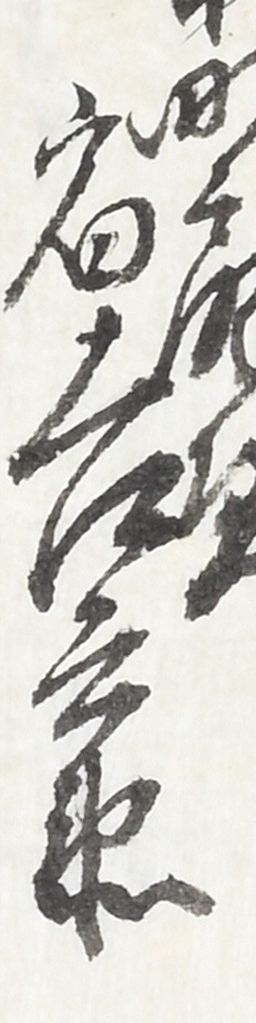宿吉兵衛
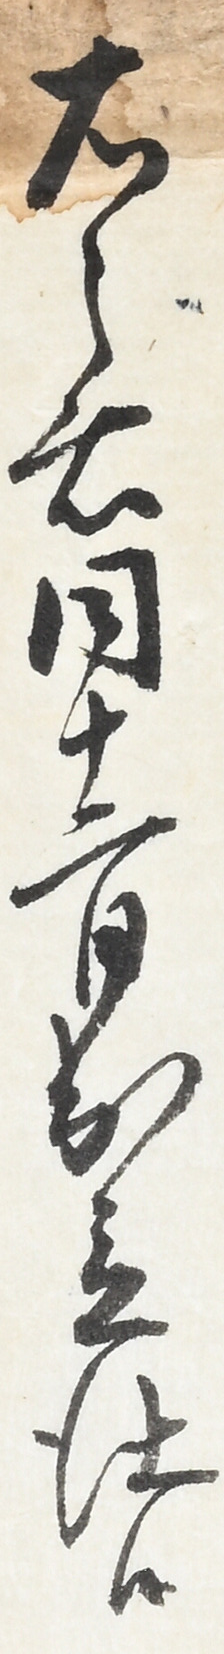右之者同十二日出立仕候

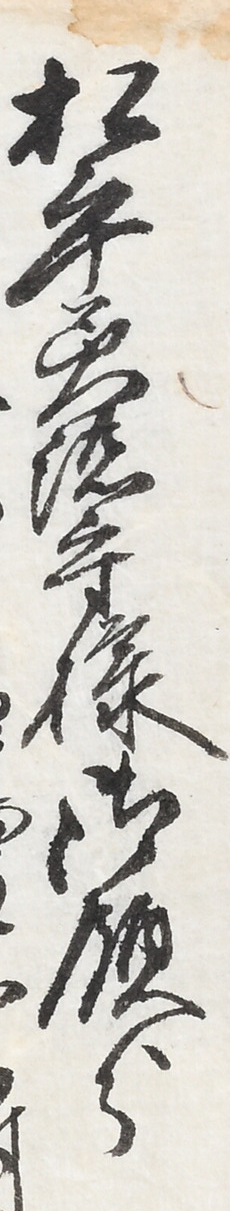松平美濃守様御領分
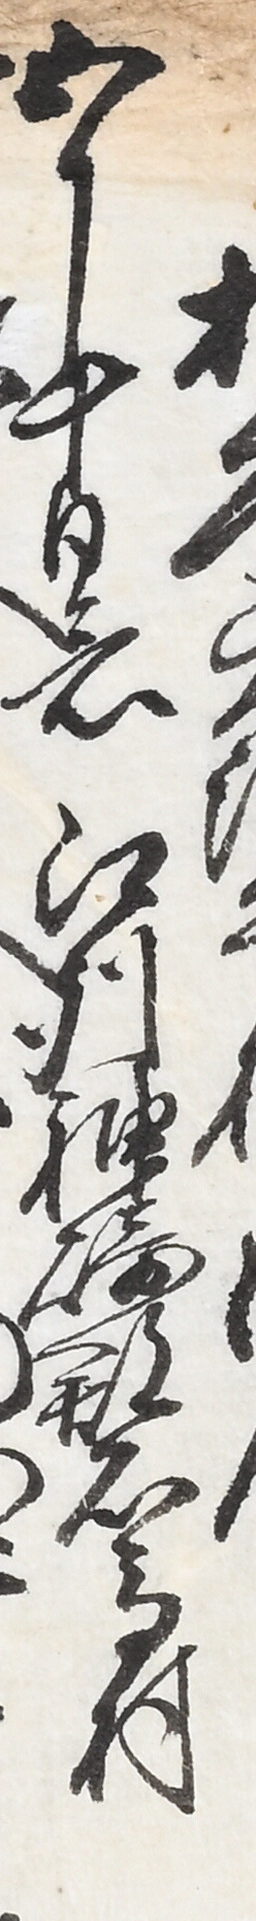五月十日着江州神崎郡石馬村
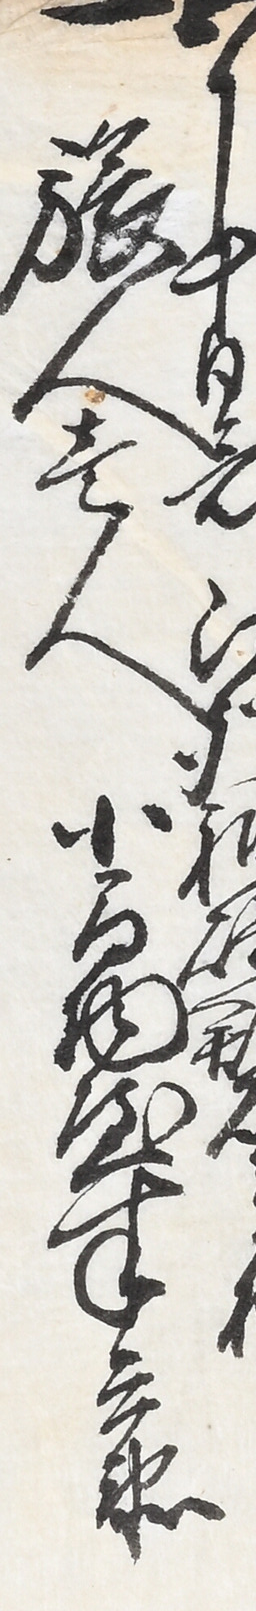一旅人壱人小間物屋半兵衛
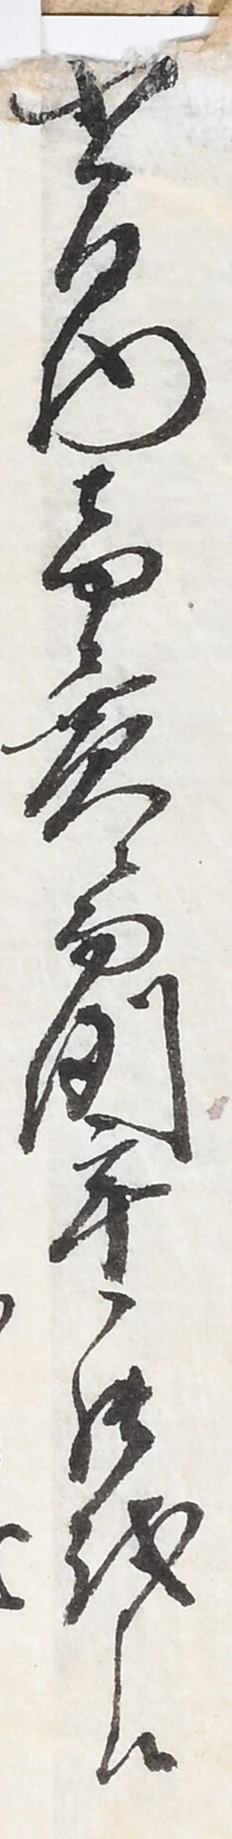小間物商売ニ而例年罷越申候
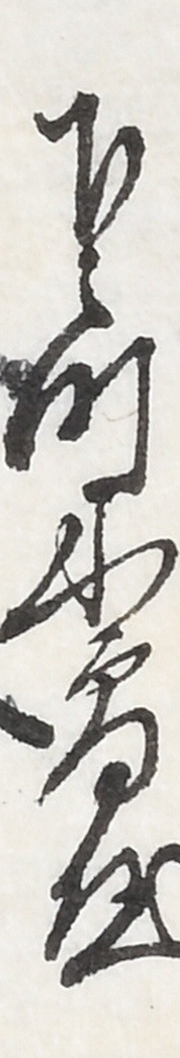下モ町木曽屋
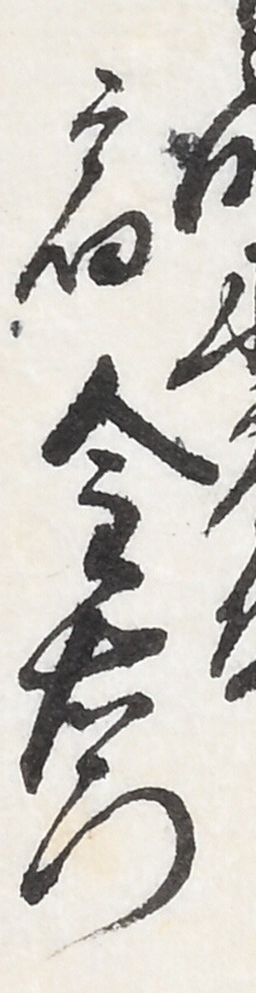宿金右衛門
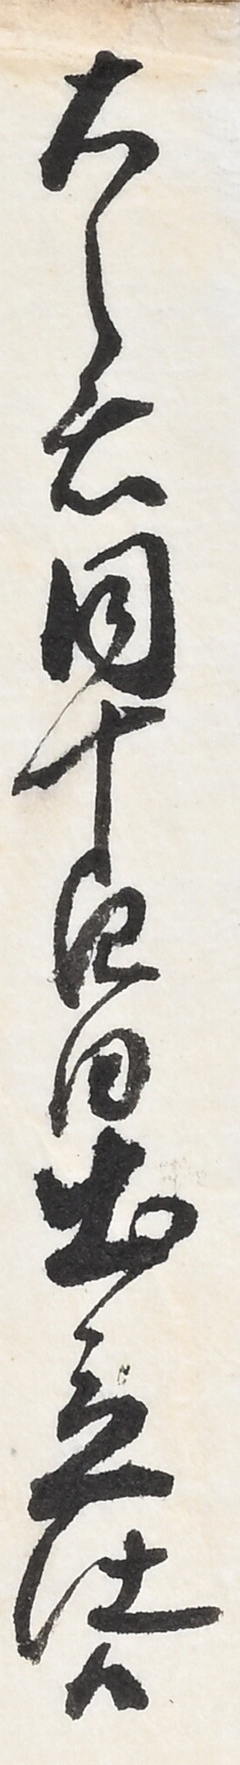右之者同十四日出立仕候
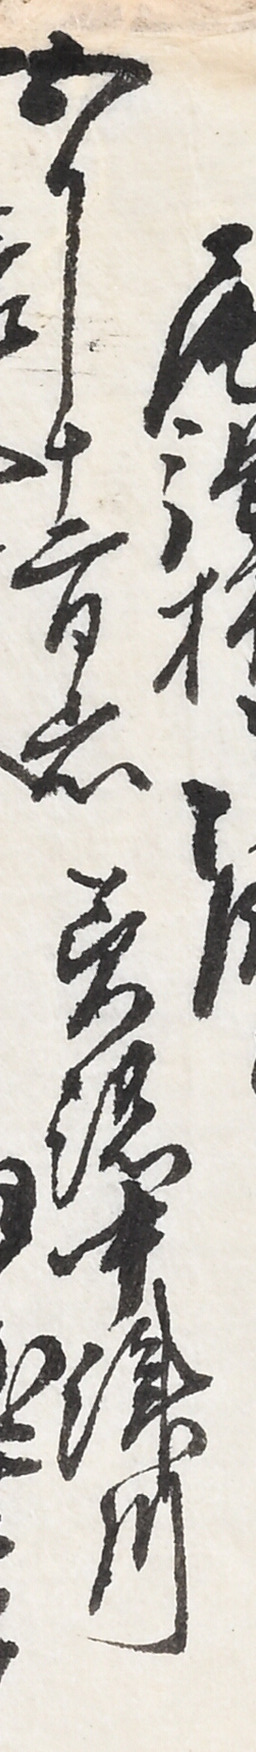五月十二日着美濃中津川
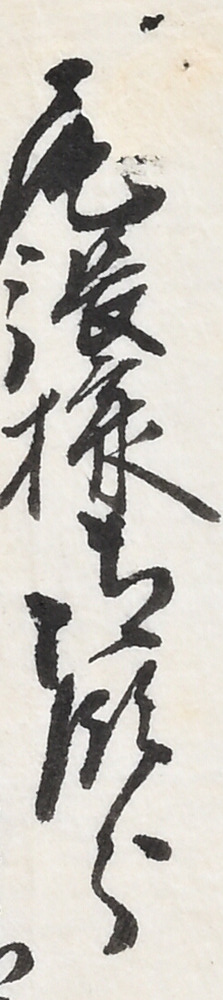尾張様御領分
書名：旅人泊控帳
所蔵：伊那市立高遠町図書館・合同会社AMANE
